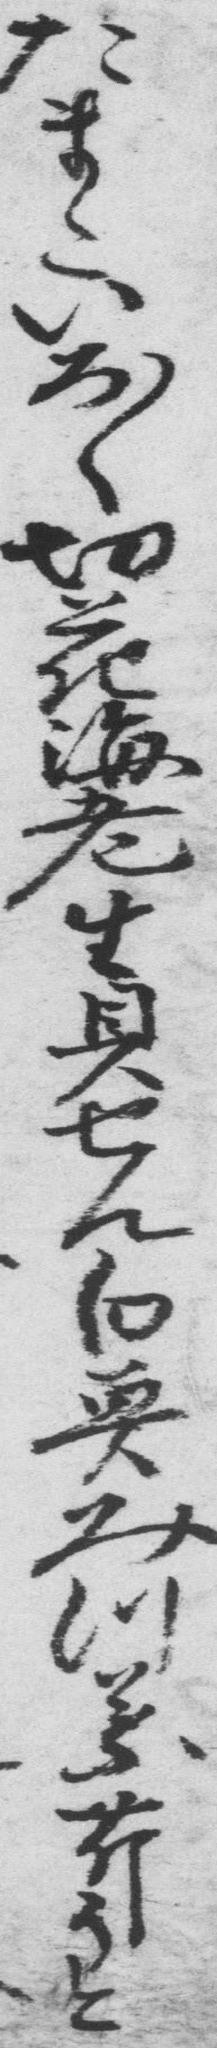たまこいろ〳〵切花海老生貝せん白魚みつ葉芹うと
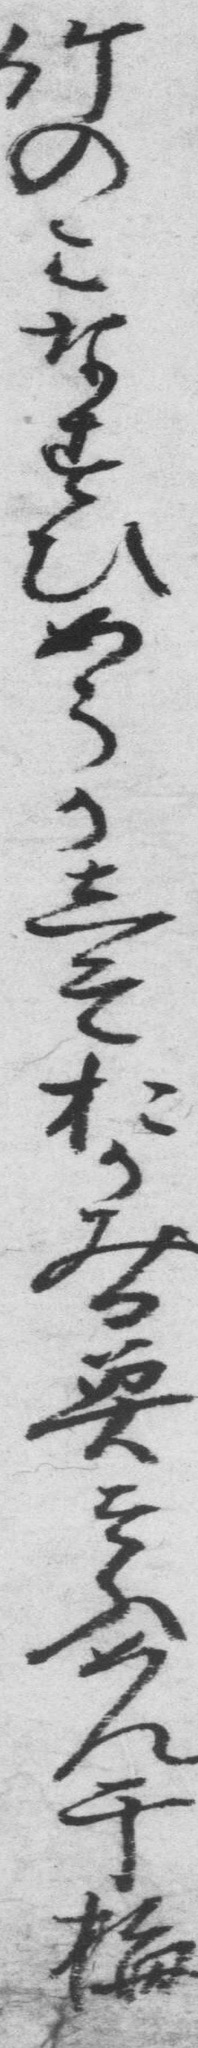竹のこなすひめうかしそおかみる魚そふめん干梅
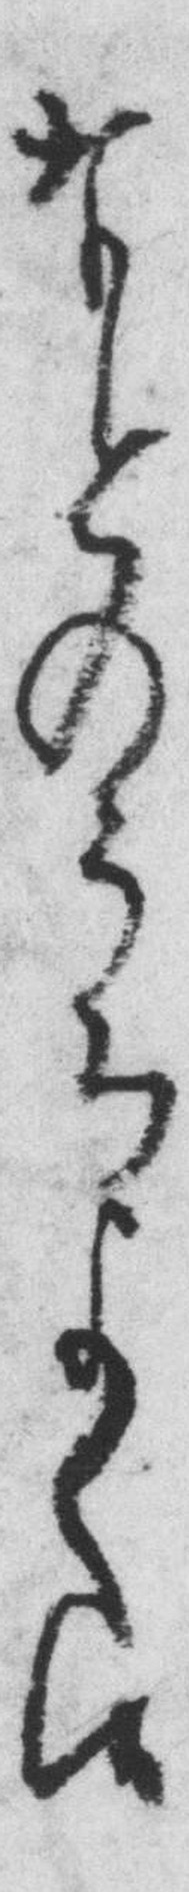なとのうちよく候

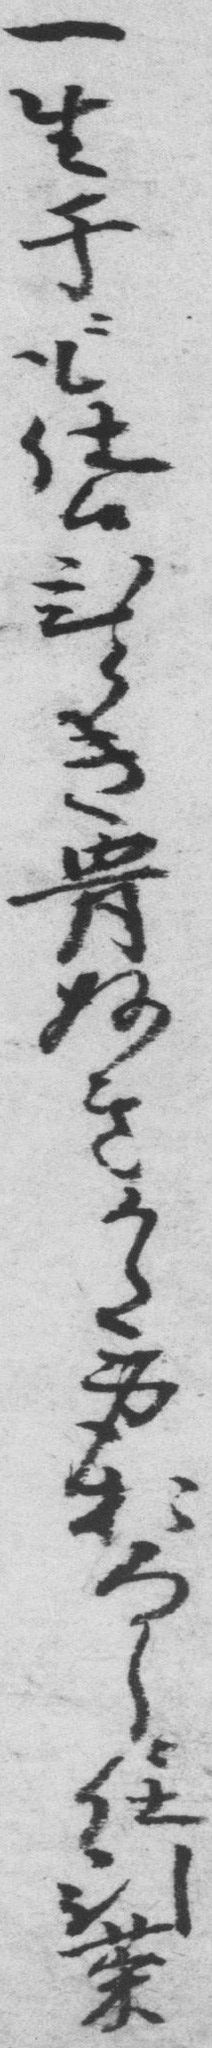一生干にも仕候ひらき骨ぬきかた身おろしに仕引菜
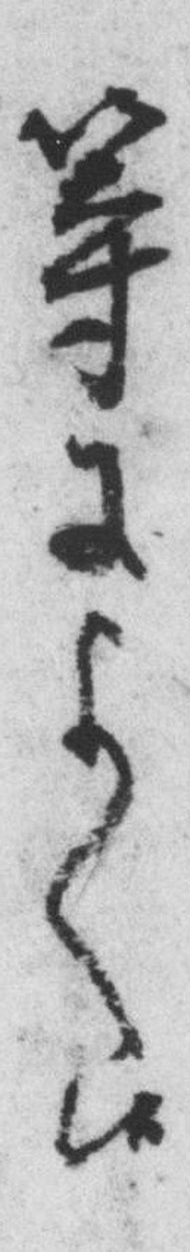等によく候
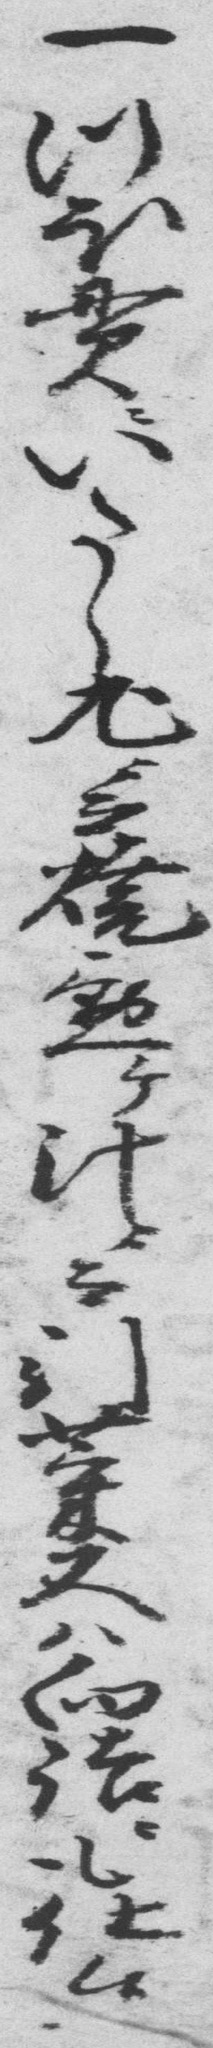一つほ貫にいたし丸にて焼懸ケ汁にて引菜又は向詰にも仕候
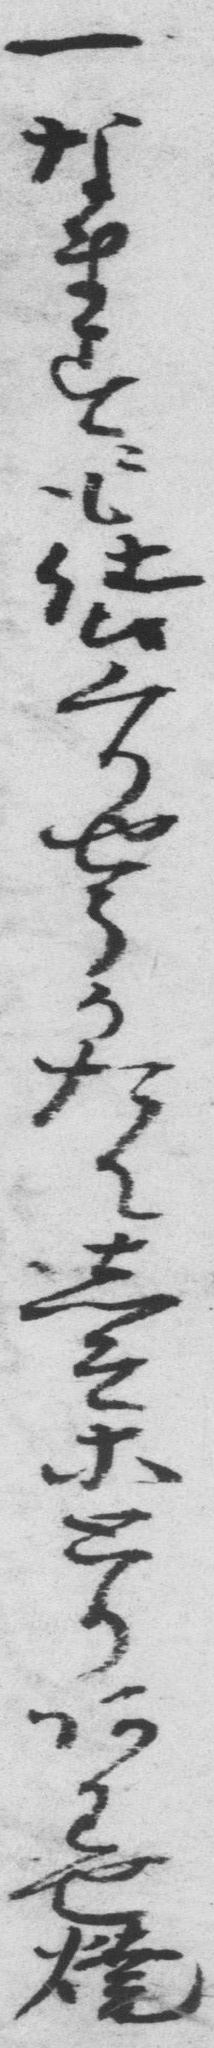一なますにも仕候くりせうかたてしそ等とりあわせ焼
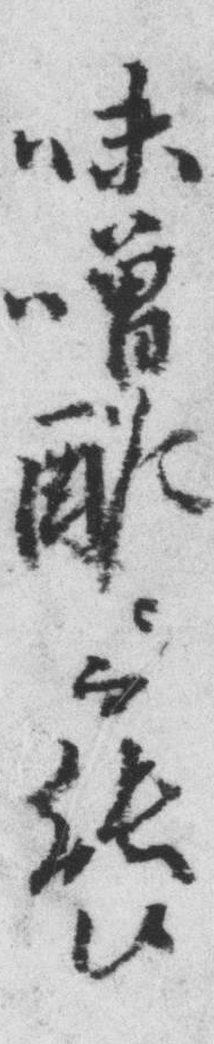味噌酢にて能候
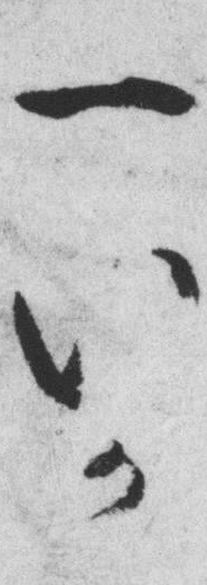一いか
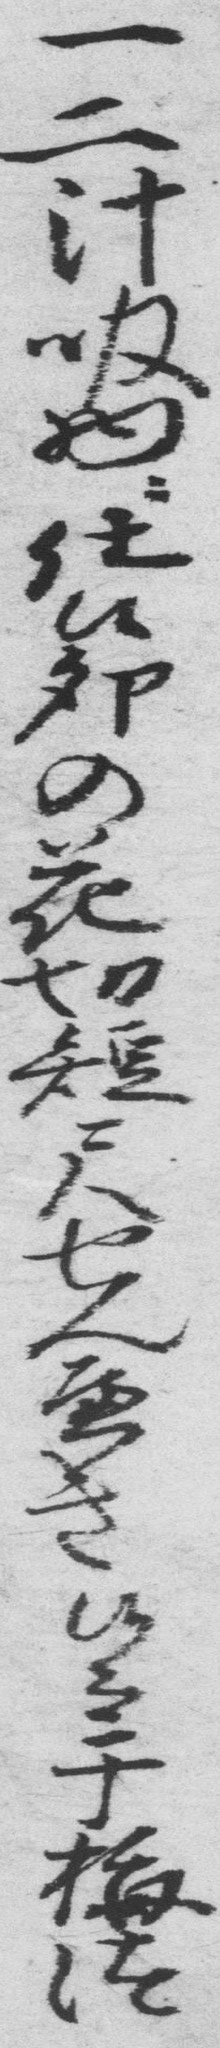一二汁吸物に仕候卯の花切短尺せん置き候て干梅つ
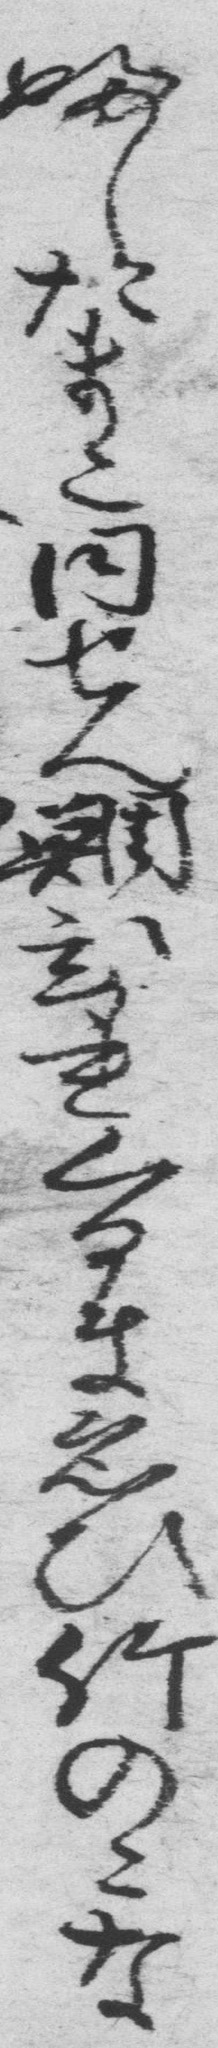ふしたまこ同せん鯛ひれくるまゑひ竹のこな
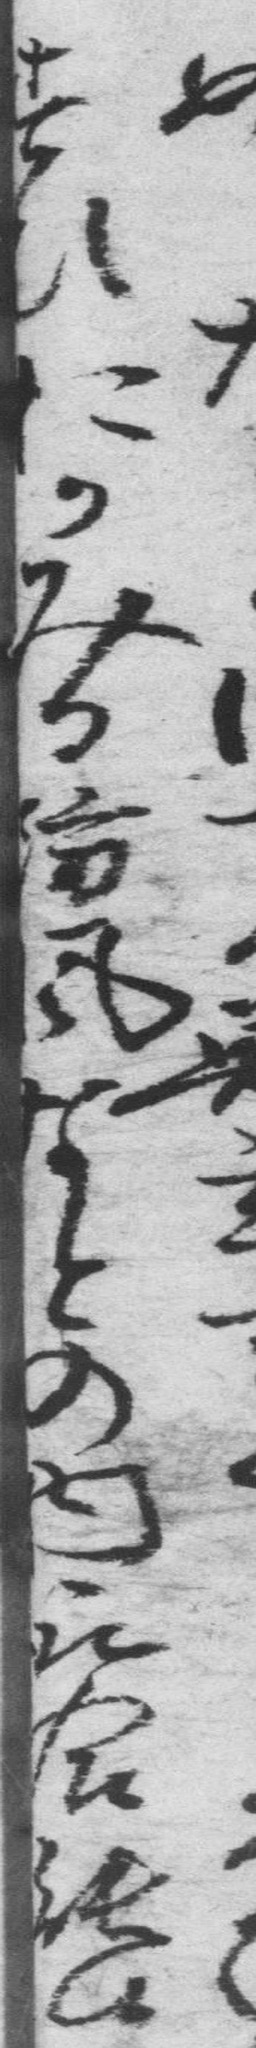すひおかみる防風なとの内取合能候
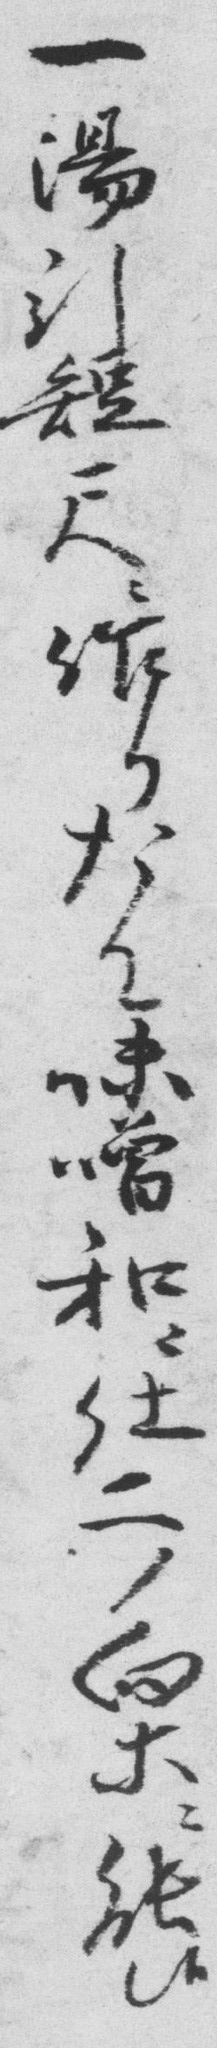一湯引短尺に作りたて味噌和に仕二の向等に能候
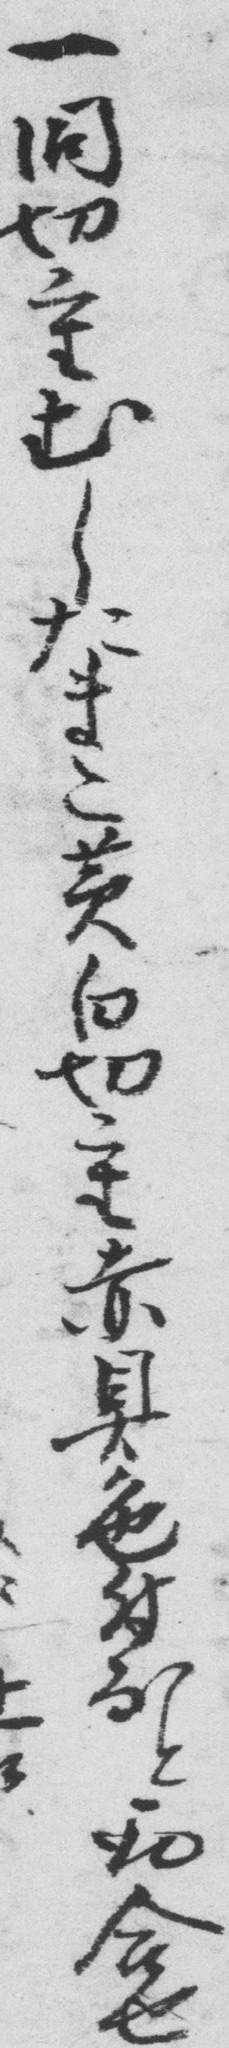一同切重むしたまこ黄白切重赤貝色付なと取合せ
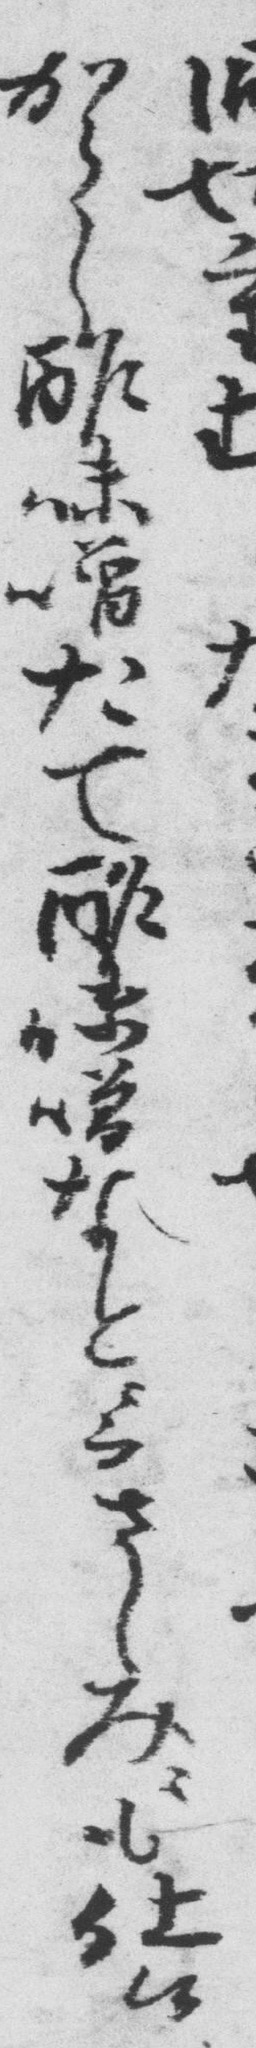からし酢味噌たて酢味噌なとにてさしみにも仕候
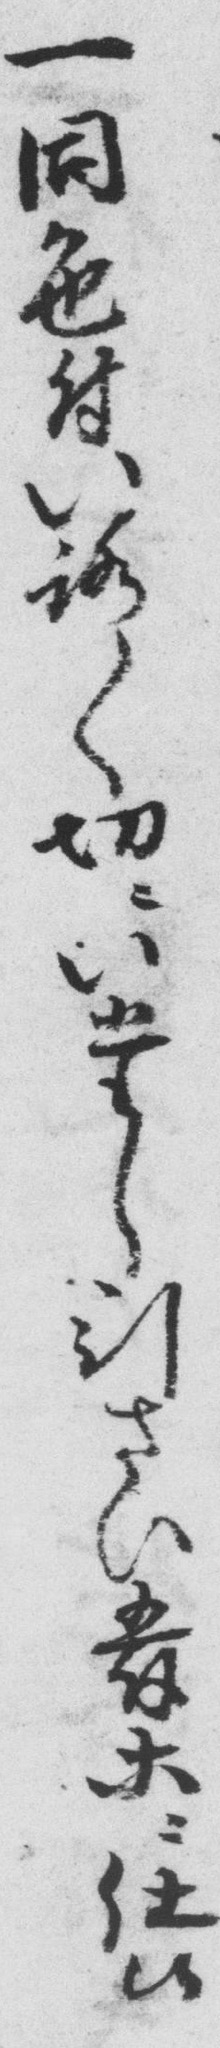一同色付いろ〳〵切にいたし引さい肴等に仕候
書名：料理集
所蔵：大阪府立大学学術情報センター 国文学研究資料館
